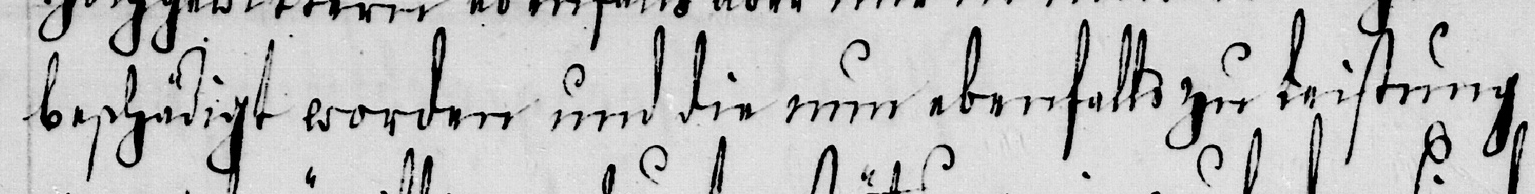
beschädigt worden und die nun ebenfalls zu Leistung
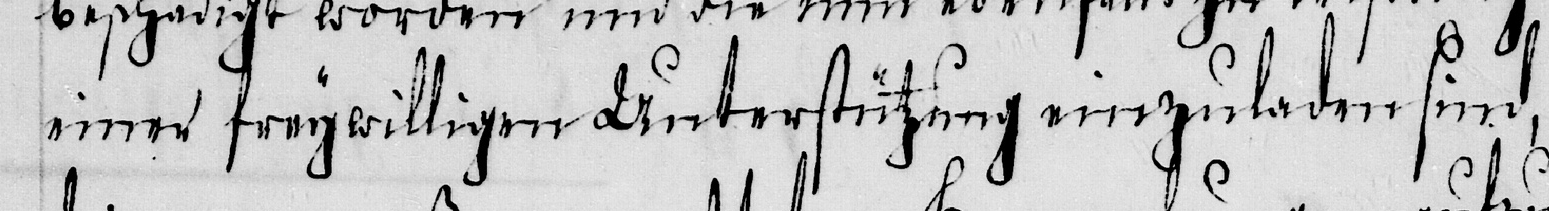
einer freywilligen Unterstützung einzuladen sind
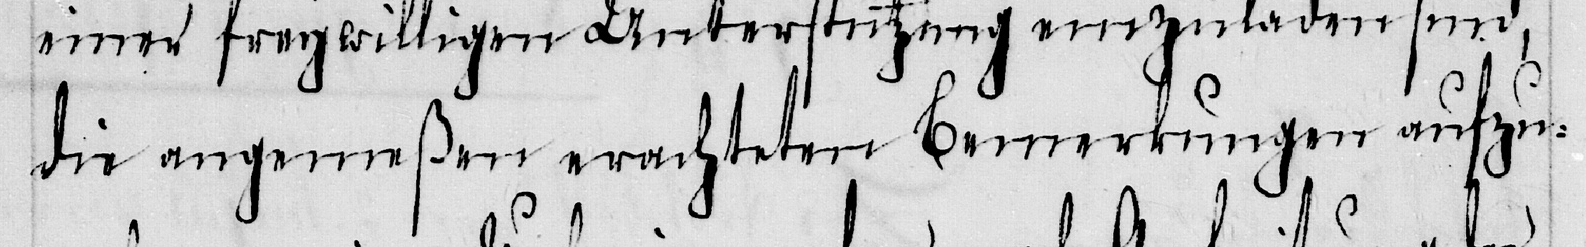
die angemeßen erachteten Bemerkungen aufzu¬
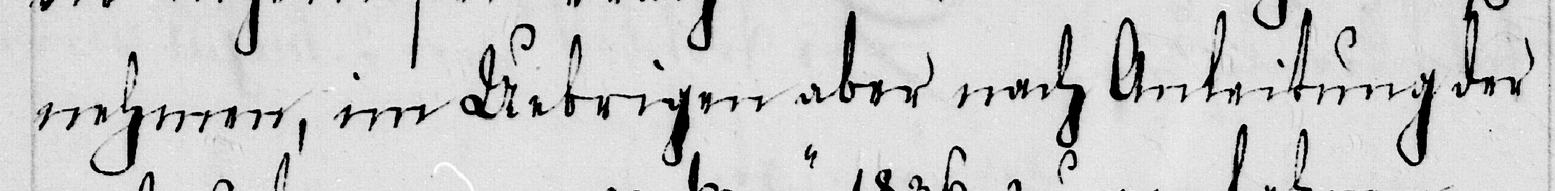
nehmen, im Uebrigen aber nach Anleitung der
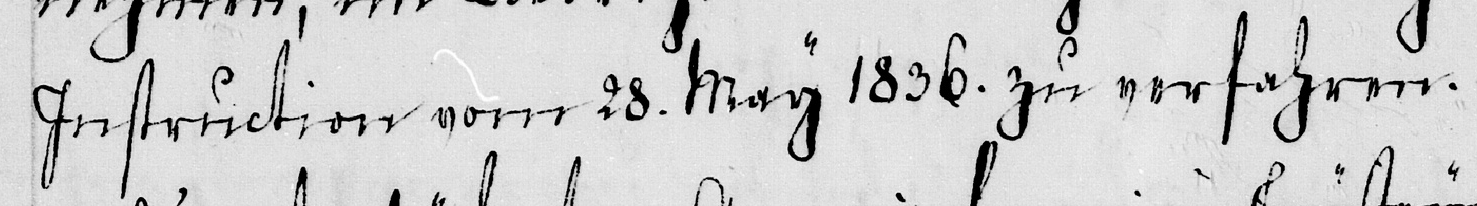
Instruction vom 28. May 1836. zu verfahren.
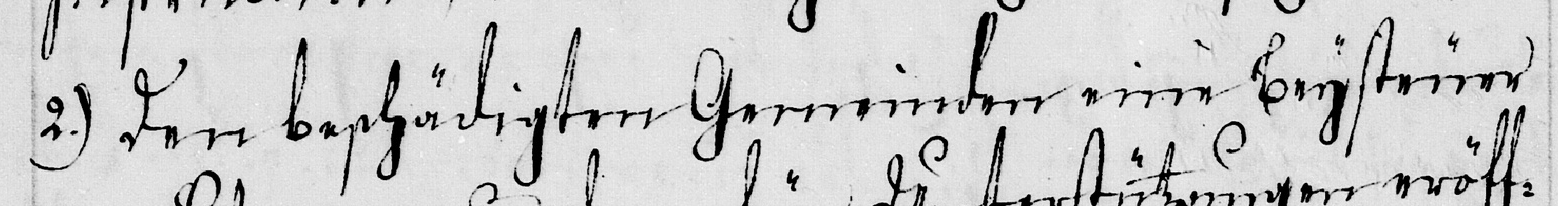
2.) Den beschädigten Gemeinden eine Beysteuer
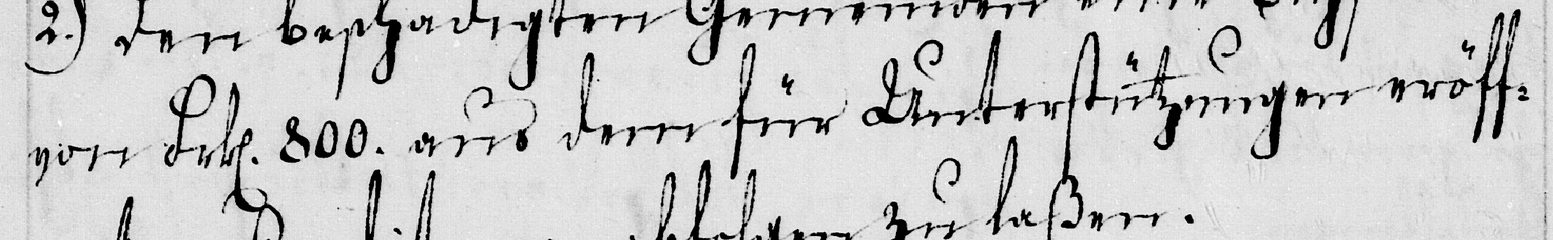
von Frk[en]. 800. aus dem für Unterstüzungen eröff¬
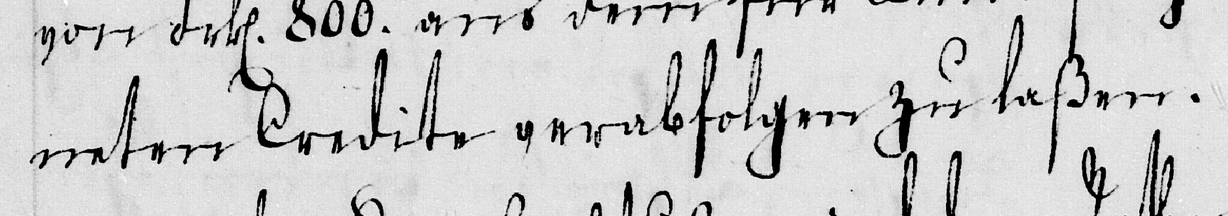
neten Credite verabfolgen zu laßen.
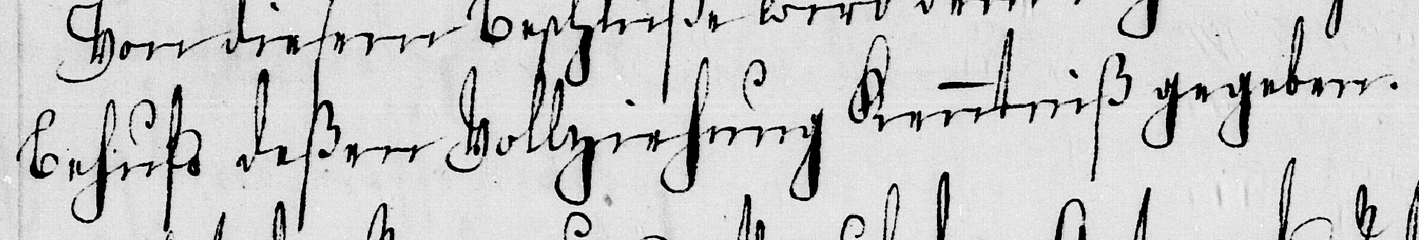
Behufs deßen Vollziehung Kenntniß gegeben.
